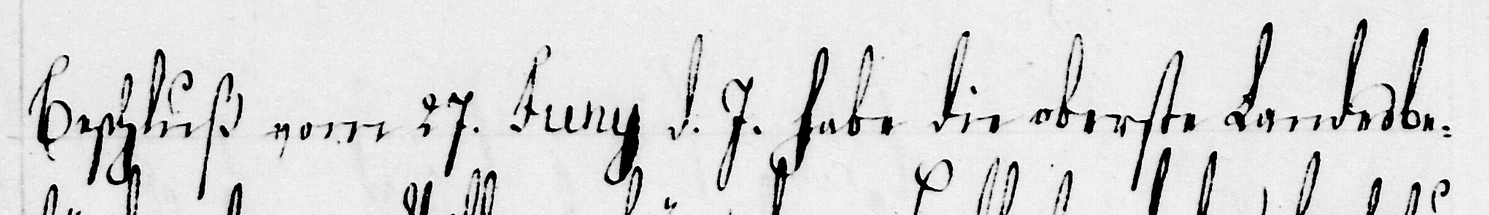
Beschluß vom 27. Juny d. J. habe die oberste Landesbe¬
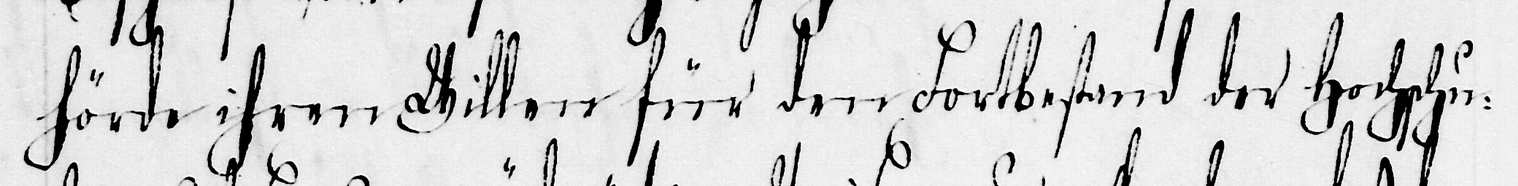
hörde ihren Willen für den Fortbestand der Hochschu¬
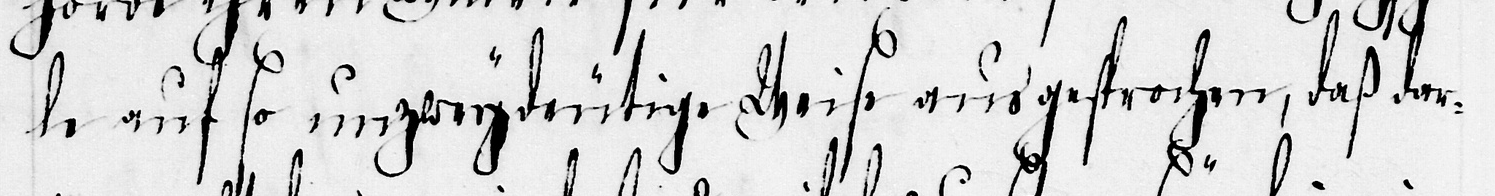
le auf so unzweydeutige Weise ausgesprochen, daß dar¬
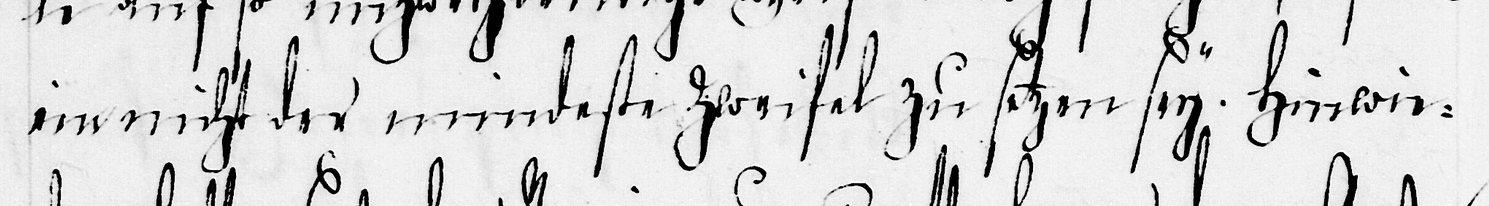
ein nicht der mindeste Zweifel zu setzen sey. Hinwie¬
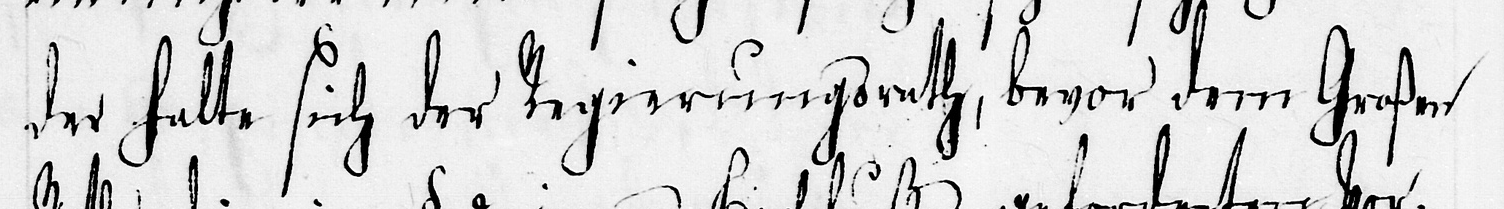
der halte sich der Regierungsrath, bevor dem Großen
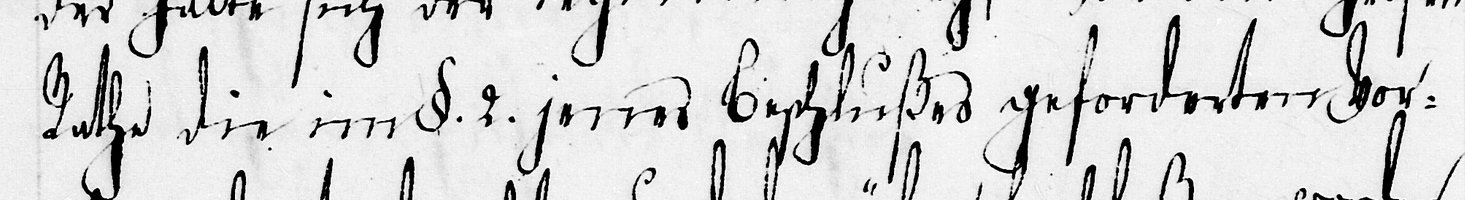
Rathe die im §. 2. jenes Beschlußes geforderten Vor¬
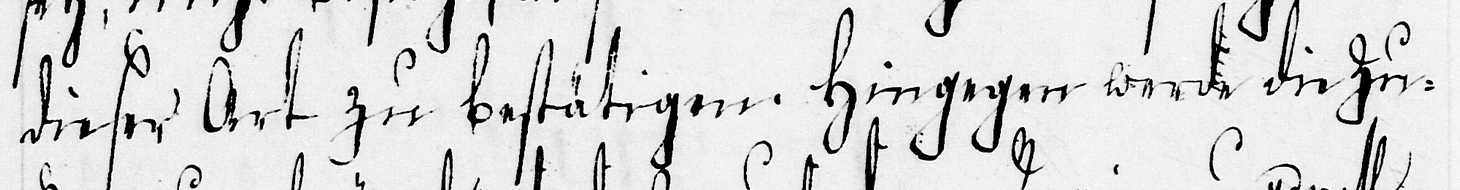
dieser Art zu bestätigen. Hingegen werde die Zu¬
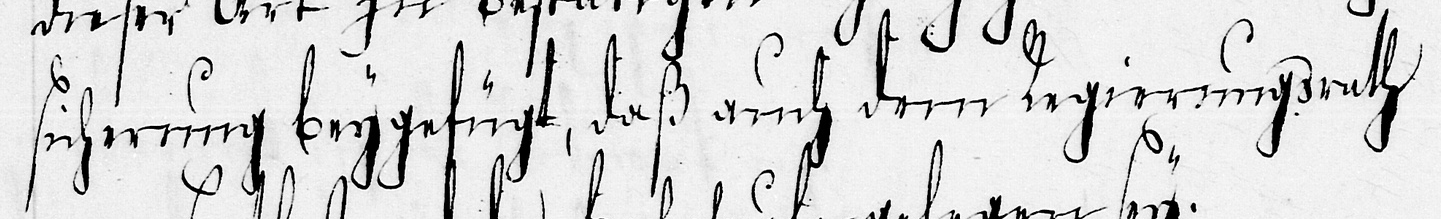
sicherung beygefügt, daß auch dem Regierungsrath
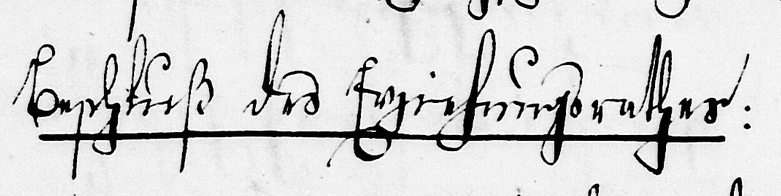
Beschluß des Erziehungsrathes:
